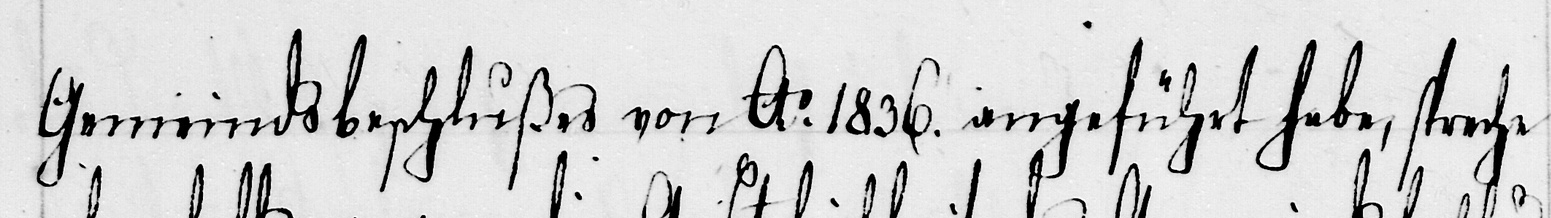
Gemeindsbeschlußes von A°. 1836. angeführt habe, spreche
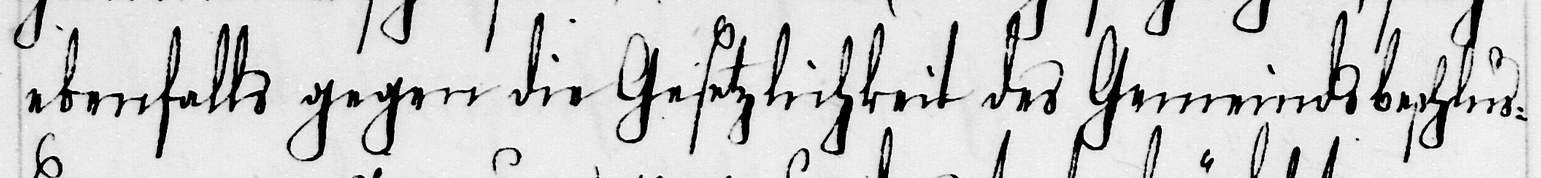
ebenfalls gegen die Gesetzlichkeit des Gemeindsbeschlu¬
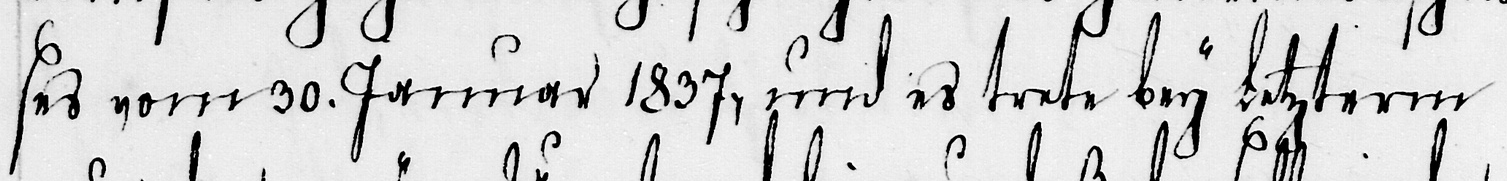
ßes vom 30. Januar 1837., und es trete bey Letzterm
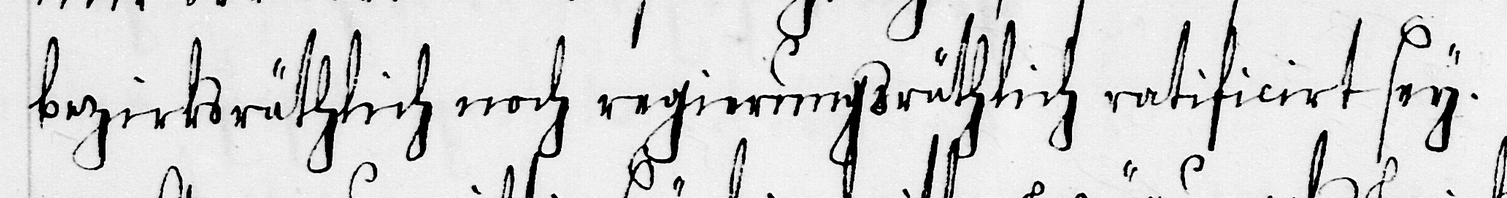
bezirksräthlich noch regierungsräthlich ratificirt sey.
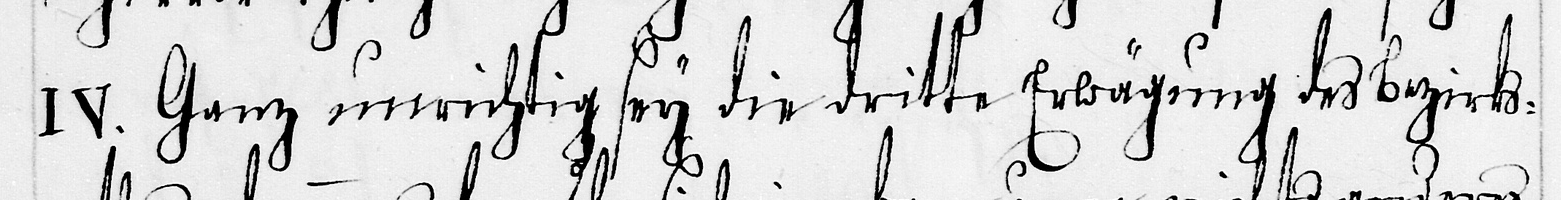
IV. Ganz unwichtig sey die dritte Erwägung des Bezirks¬
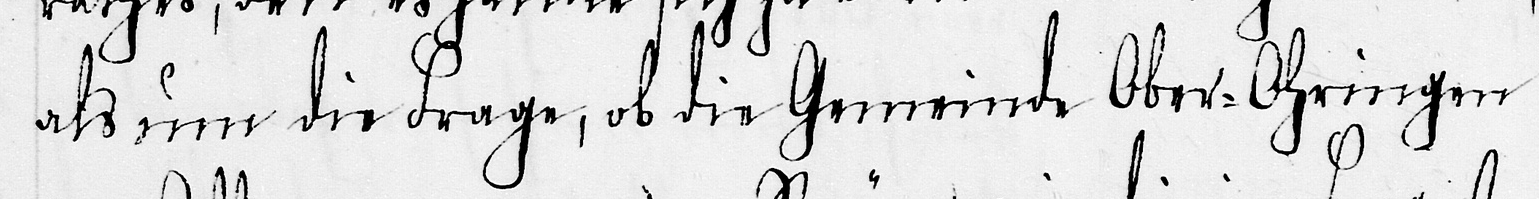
als um die Frage, ob die Gemeinde Ober-Ohringen
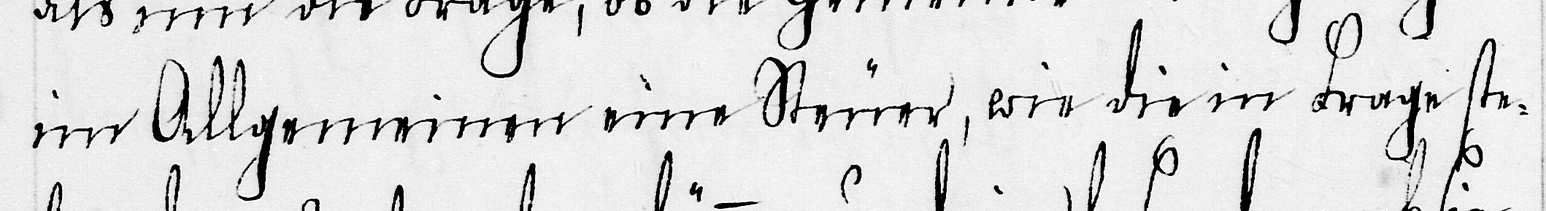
im Allgemeinen eine Steuer, wie die in Frage ste¬
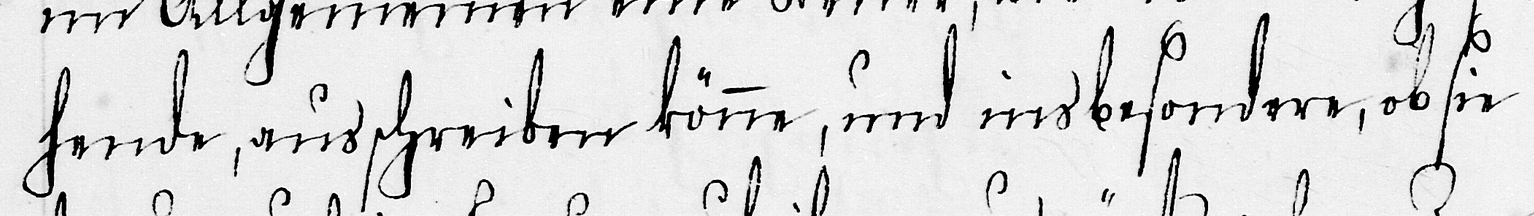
hende, ausschreiben könne, und insbesondere, ob sie
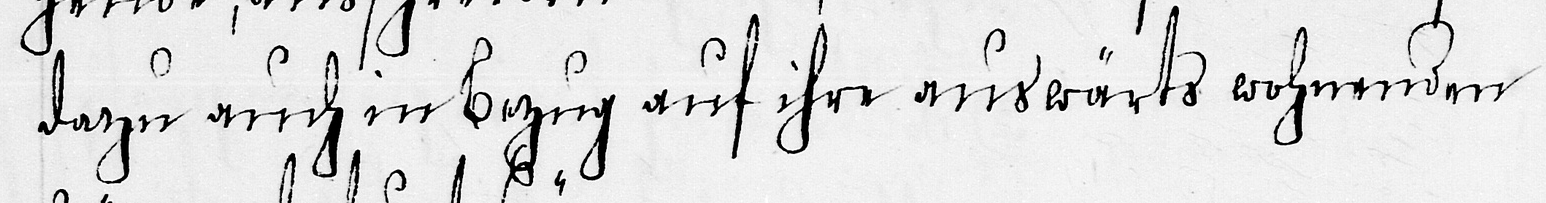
dazu auch in Bezug auf ihre auswärts wohnenden
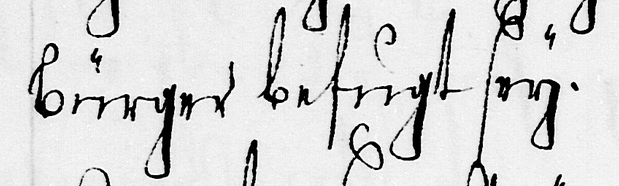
Bürger befugt sey.
